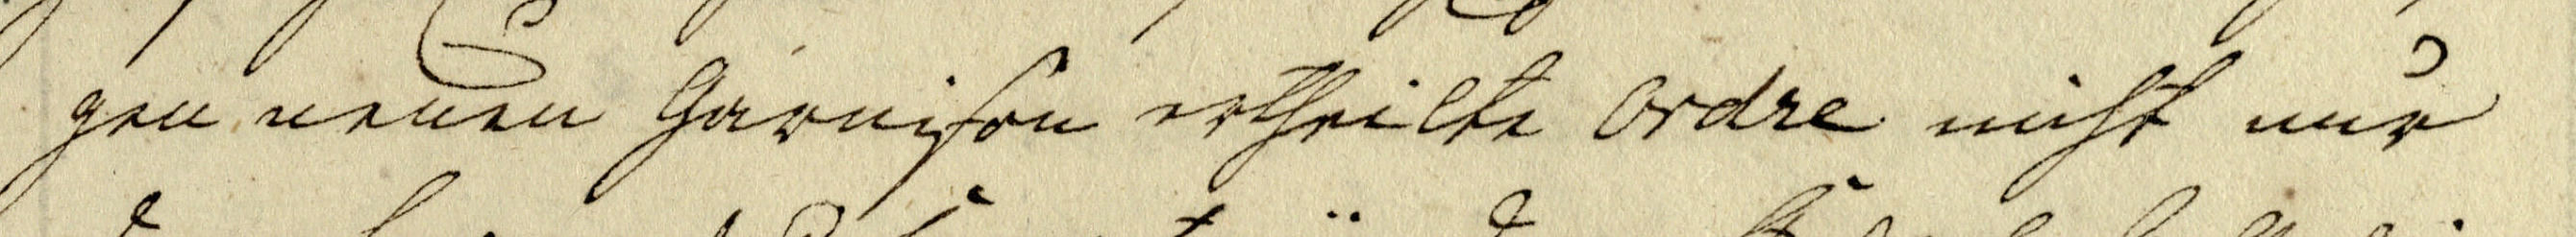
gen neuen Garnison ertheilte Ordre nicht nur
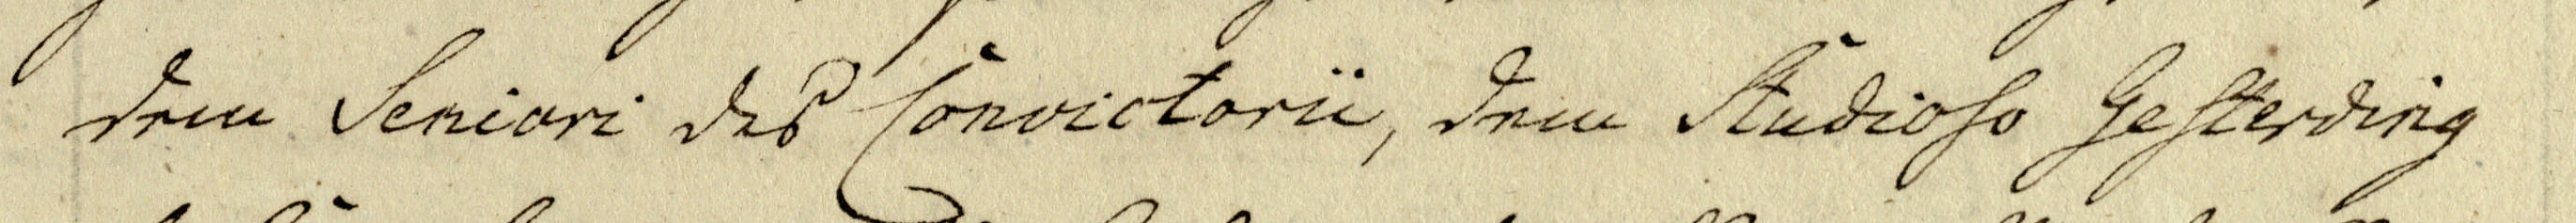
dem Seniori des Convictorii, dem Studioso Gesterding
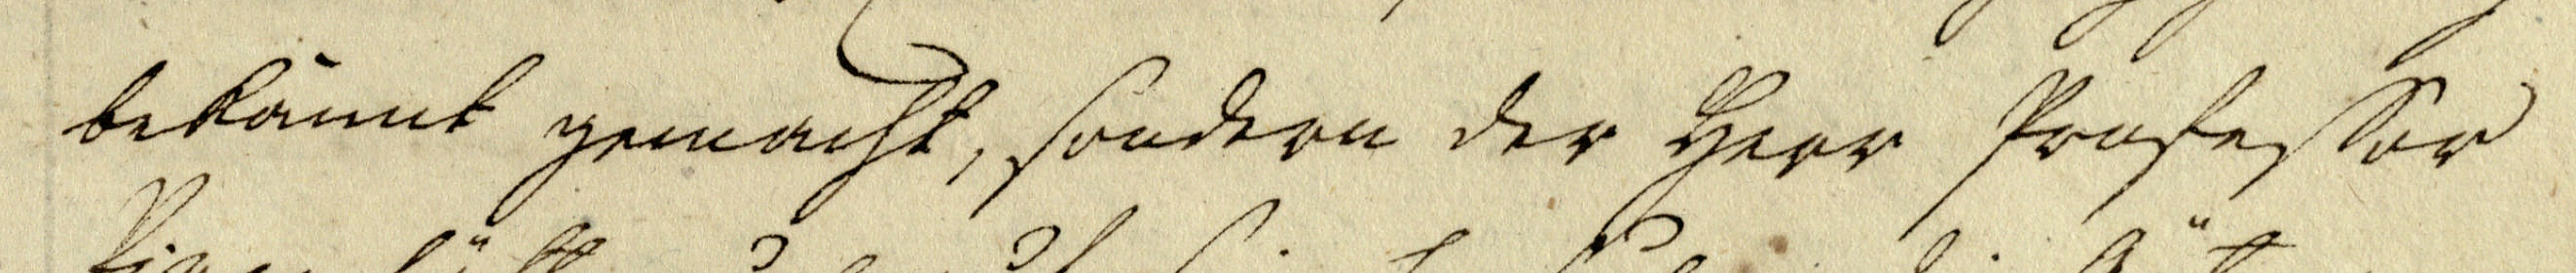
bekannt gemacht, sondern der Herr Professor
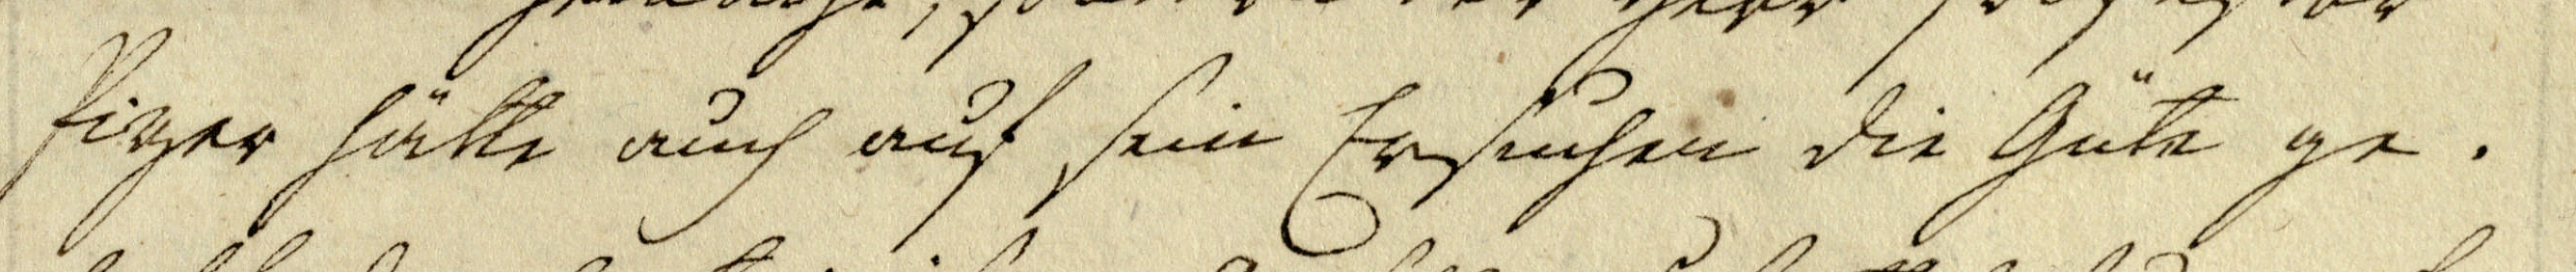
Piper hätte auch auf sein Ersuchen die Güte ge¬
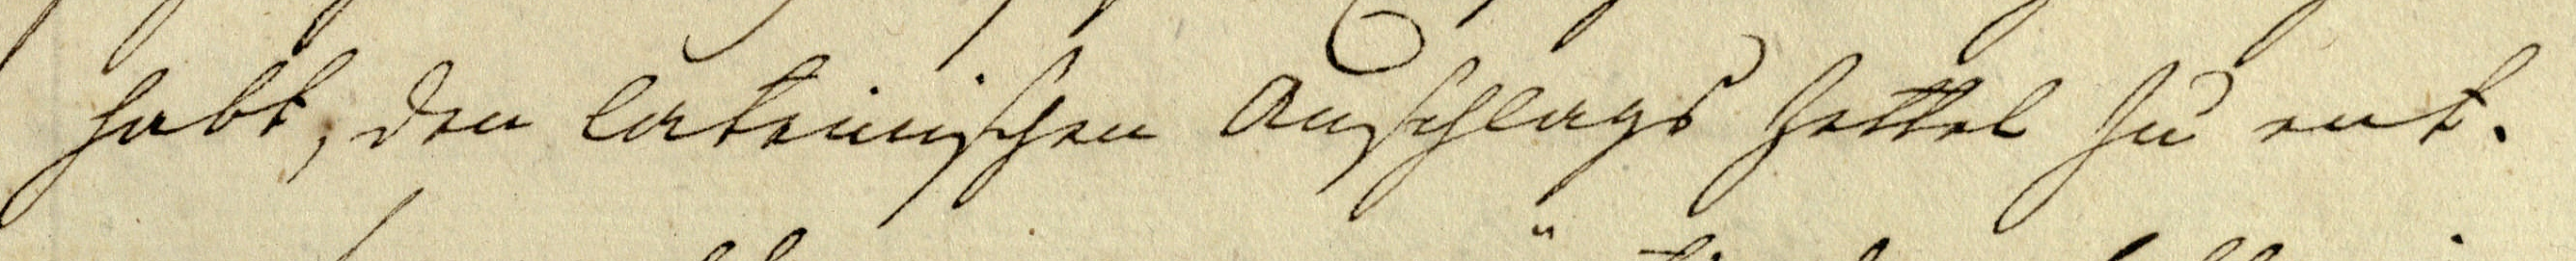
habt, den lateinischen Anschlags Zettel zu ent¬
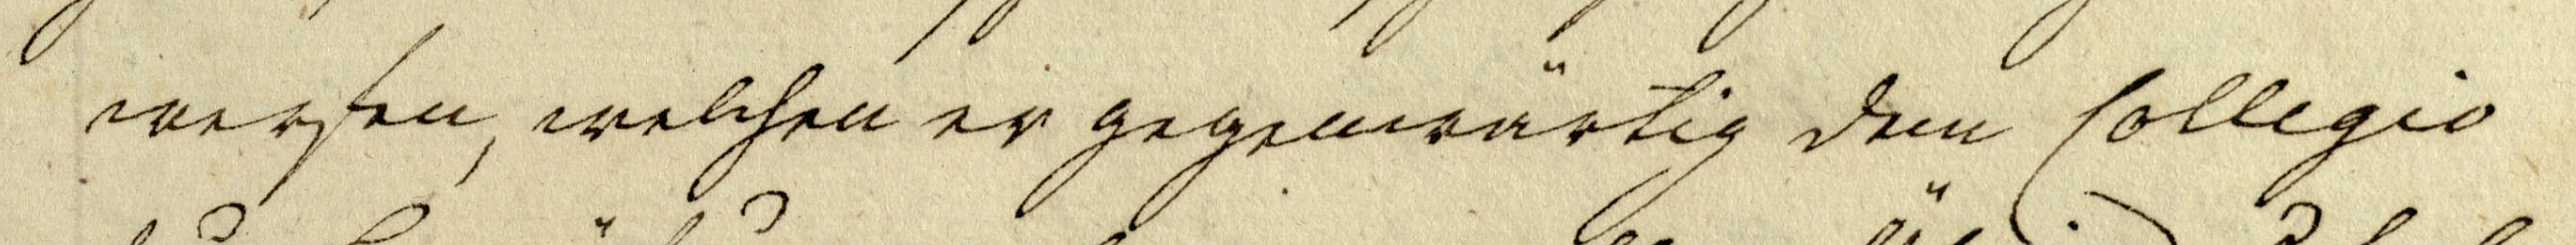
werfen welchen er gegenwärtig dem Collegio
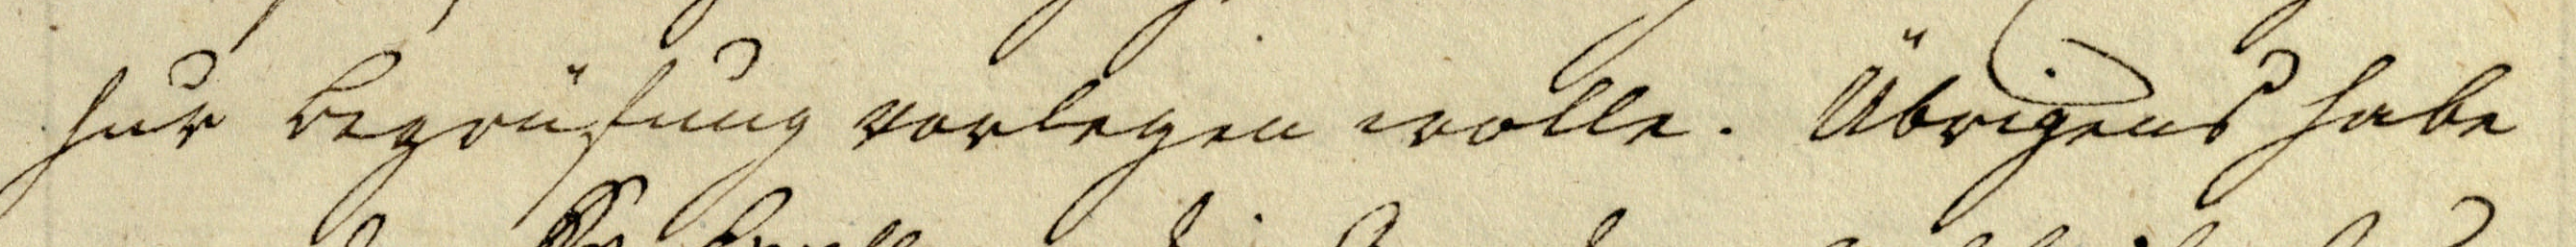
zur Beprüfung vorlegen wolle. Übrigens habe
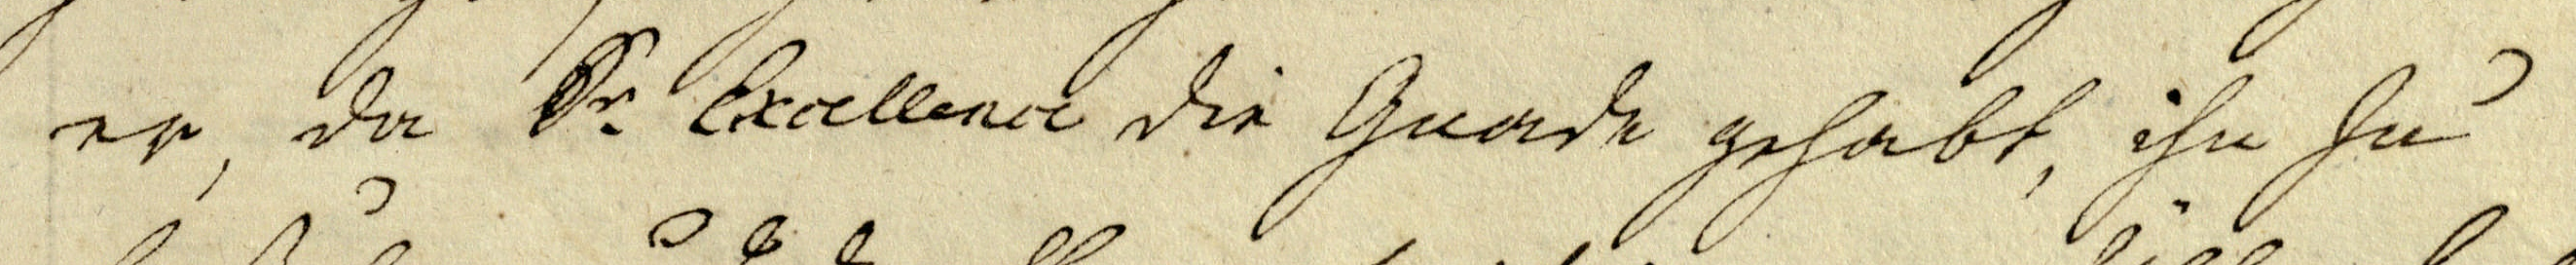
er, da Sr Excellence die Gnade gehabt, ihn zu
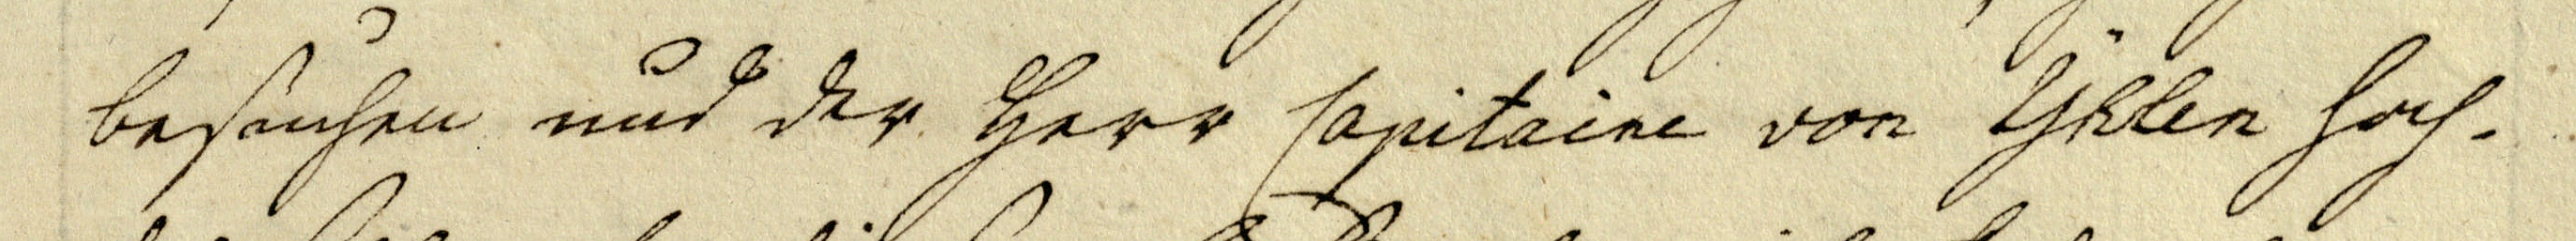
besuchen und der Herr Capitaine von Yhlen hoch¬
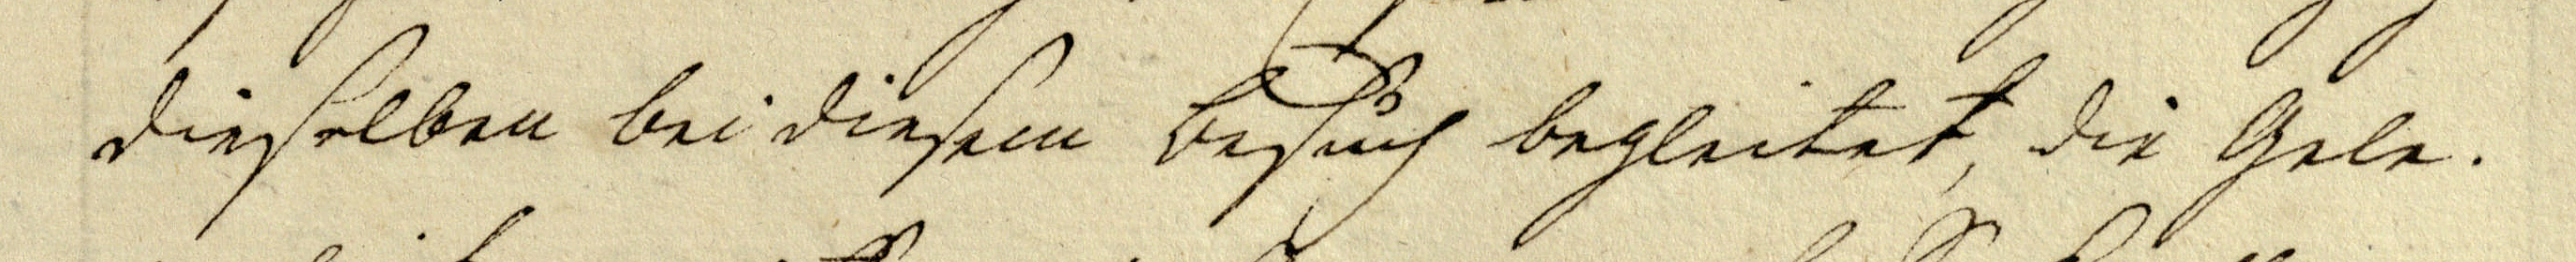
dieselben bei diesem Besuch begleitet, die Gele¬
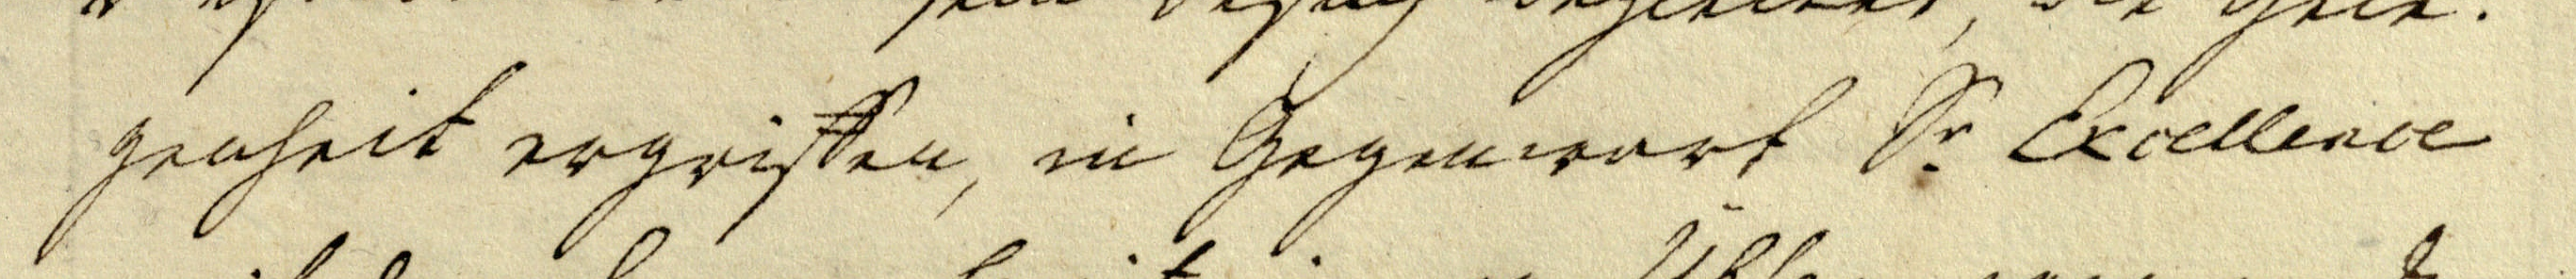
genheit ergriffen, in Gegenwart Sr Excellence
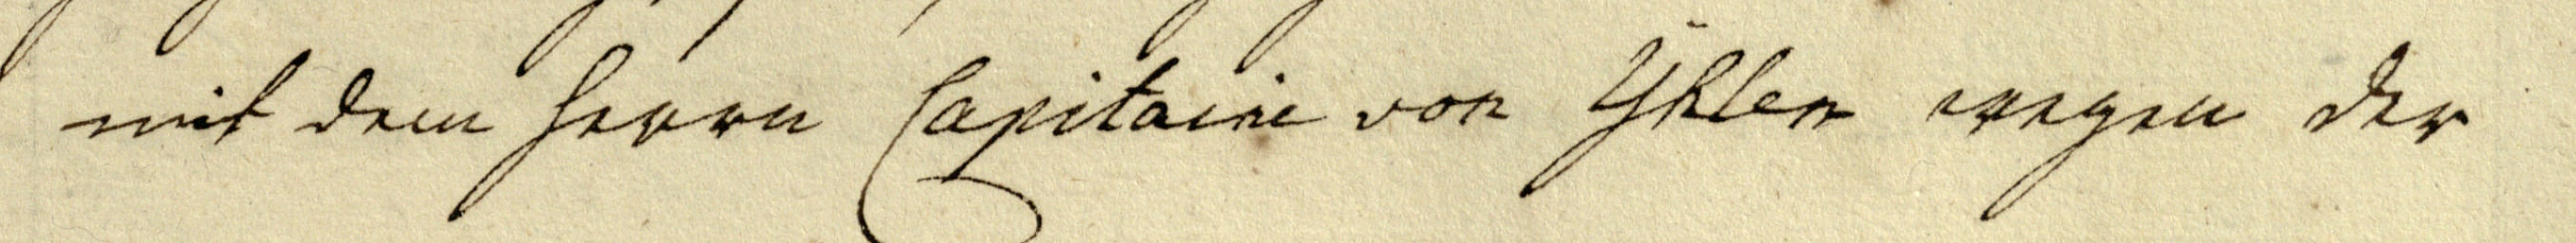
mit dem Herrn Capitaine von Yhlen wegen der
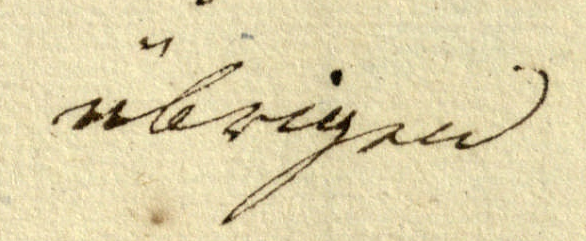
übrigen
